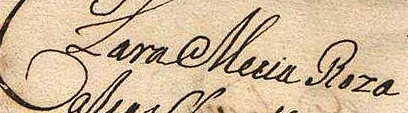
Clara Mecia Roza
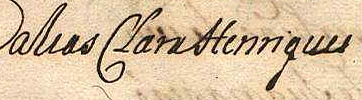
alias Clara Henriques
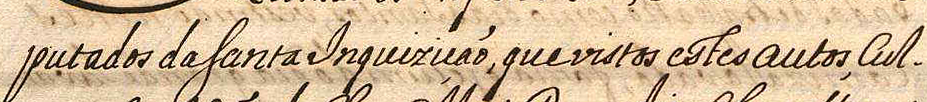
putados da santa Inquiziçaõ, que vistos estes autos, Cul
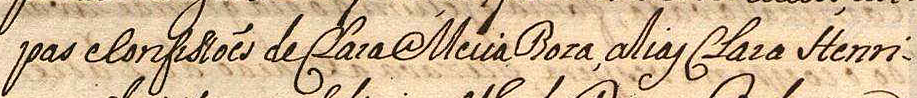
pas e confissoẽs de Clara Mecia Roza, alias CLara Henri
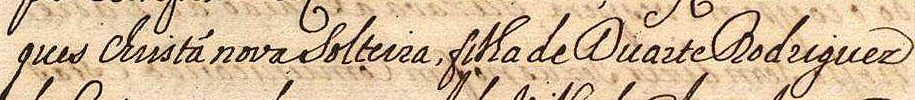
ques christã nova Solteira, filha de Duarte Rodriguez
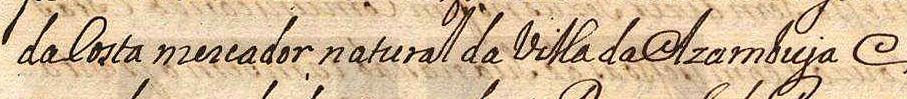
da Costa mercador, natural da Villa da Azambuja e
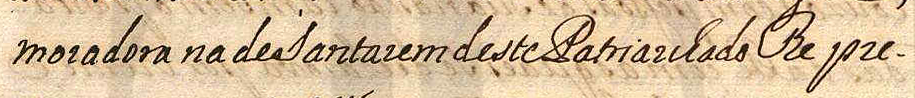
moradora na de Santarem deste Patriarchado Re pre
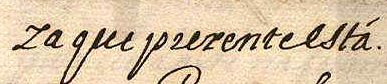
za que prezente está.
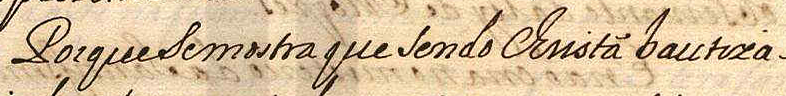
Porque Se mostra que sendo Christã bautiza
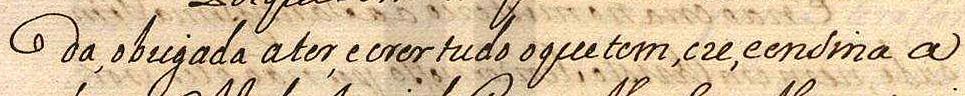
da, obrigada a ter, e crer tudo o que tem, cre, e ensina a
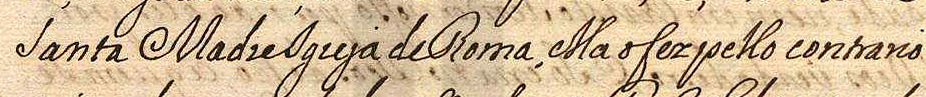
Santa Madre Igreja de Roma, ella o fez pello contrario
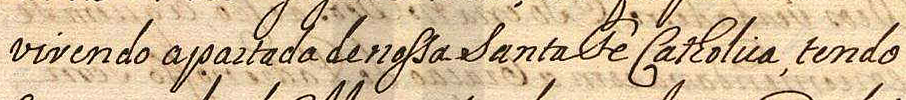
vivendo apartada de nossa Santa Fé Catholica, tendo
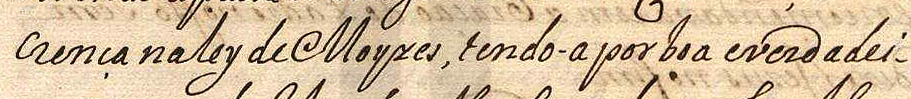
crença na ley de Moyzes, tendo-a por boa e verdadei
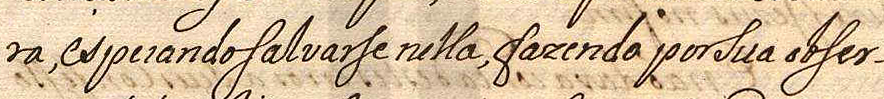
ra, esperando salvarse nella, fazendo por Sua obser
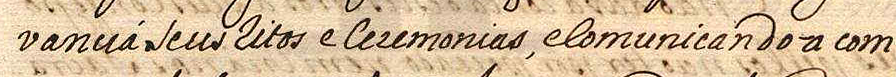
vancia seus Ritos e ceremonias, e comunicando-a com
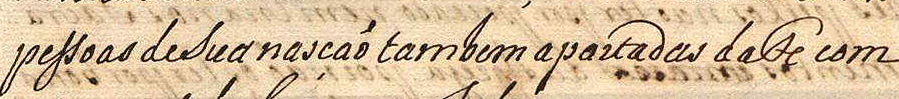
pessoas de sua nasçaõ tambem apartadas da Fe com
